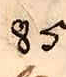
85
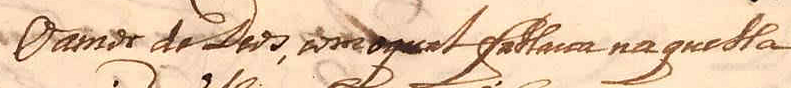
O amor de Deos, com o qual fallaua naquella
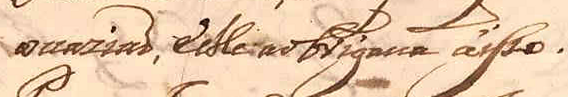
occaziaõ, e elle a obrigaua a isso.
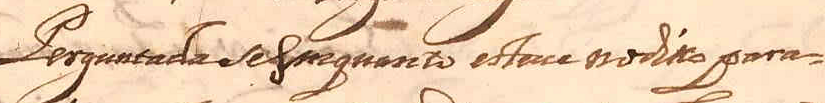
Perguntada se emquanto esteue no ditto para
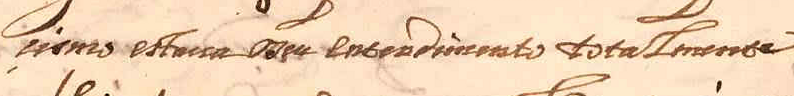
cismo estaua o seu entendimento totalmente
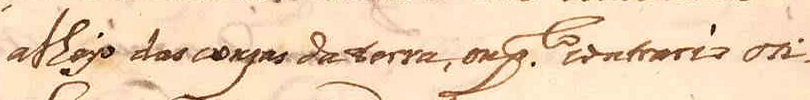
alheyo das cousas da terra, ou p.lo contrario o ti
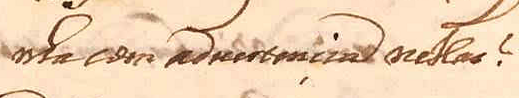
nha com aduertencia nellas?
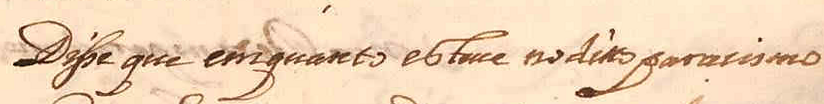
Disse que emquanto esteue no ditto paracismo
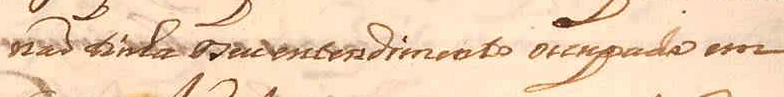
naõ tinha o seu entendimento occupado em
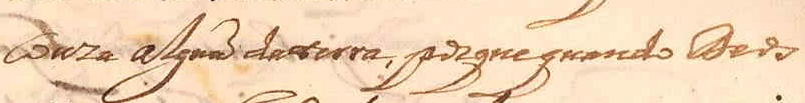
couza alguā da terra, porque quando Deos
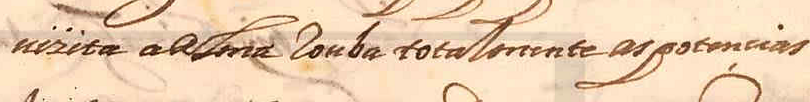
uizita a alma Rouba totalmente as potencias
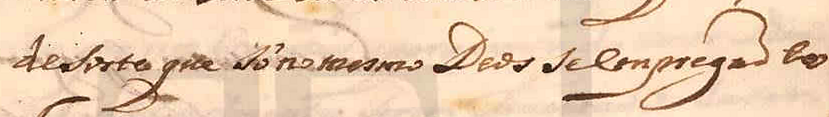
de sorte que só no mesmo Deos se empregaõ to
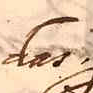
das.
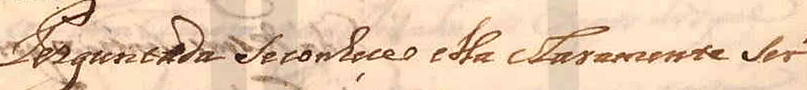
Perguntada se conheceo ella claramente ser
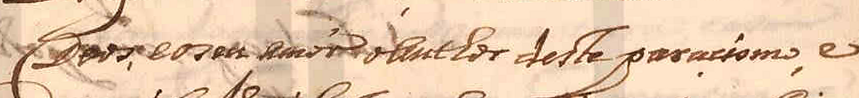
Deos, e o seu amor o Author deste paracismo, e
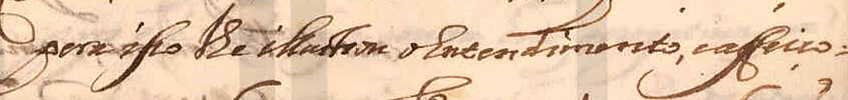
pera isso lhe illustrou o Entendimento, e affeiço
